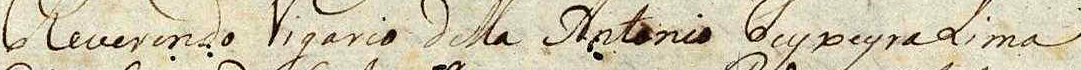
Reverendo Vigario della Antonio Teyxeyra Lima
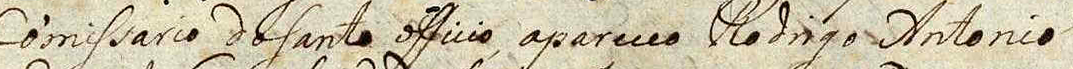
Cōmissario do santo officio, apareceo Rodrigo Antonio
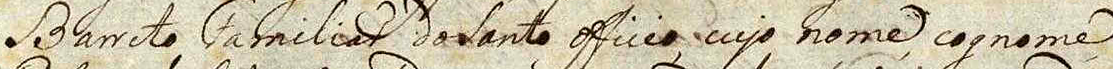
Barreto Familiar do Santo officio, cujo nome, cognome
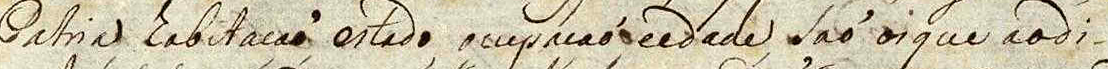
Patria, habitaçaõ, estado, ocupaçaõ e edade, saõ os que ao di
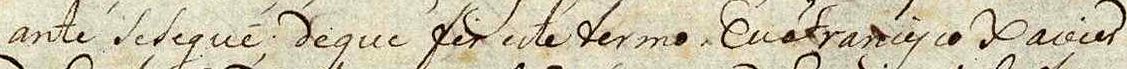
ante se segue; de que fis este termo. Eu o Francisco Xavier
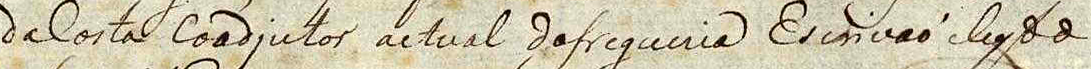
da Costa Coadjutor actual da freguesia Escrivaõ eleyto
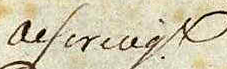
o escrevy
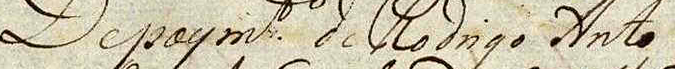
Depoym.to de Rodrigo Anto
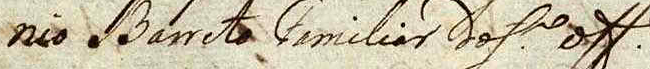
nio Barreto Familiar do sto. off.o
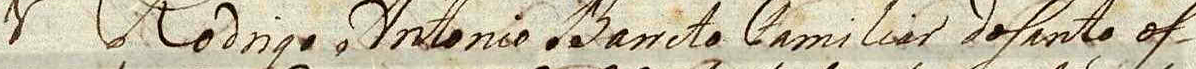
1.o Rodrigo Antonio Barreto Familiar do Santo of
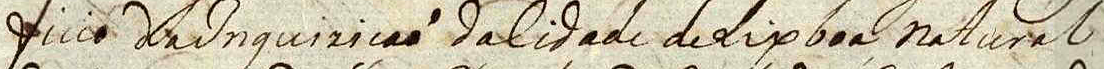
ficio da Inquizicaõ da Cidade de Lixboa natural
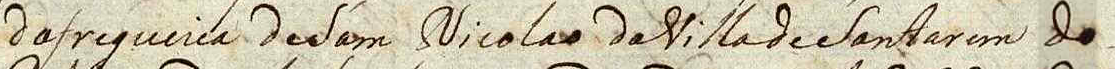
da freguezia de Sam Nicolao da Villa de Santarem do
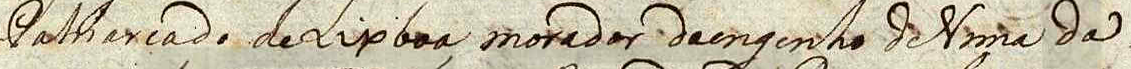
Patriarcado de Lixboa, morador do engenho de Vnna da
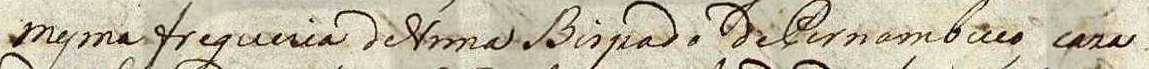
mesma freguezia de Vnna Bispado de Pernambuco, caza
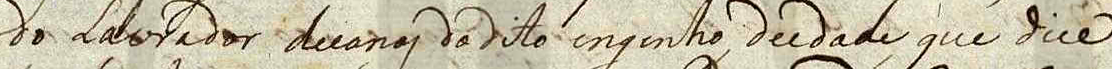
do Lavrador de canas do dito engenho, de edade, que dice
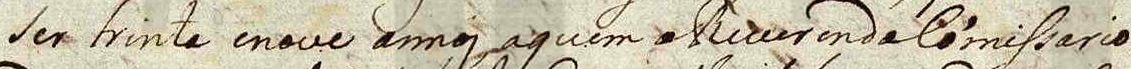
ser trinta e nove annos, a quem o Reuerendo Comissario
